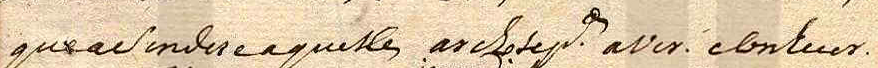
que asendese aquelle archote p.a a ver e conhecer.
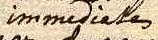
immediata
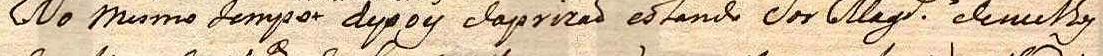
No mesmo tempo + depois da prizaõ estando Sor Magd.a de iuelhos
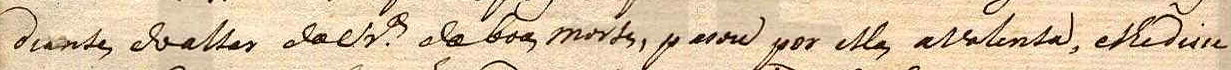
diante do altar da Sr.a da boa morte, pasou por ella a Valenta, e lhe disse
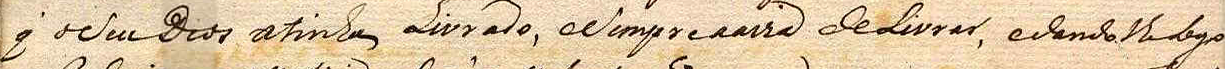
q̄ o seu Deos a tinha Livrado, e Sempre a avia de Livrar, e dando lhe logo
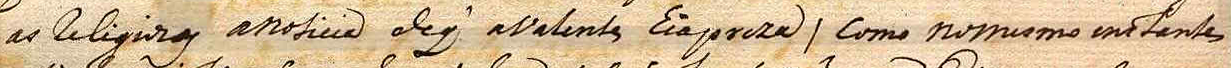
as Religiozas a noticia de q̄ a valente hia preza/ como no mesmo instante
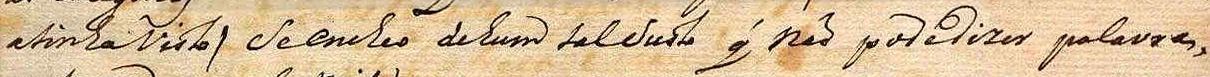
a tinha visto/ se encheo de hum tal susto q̄ naõ pode dizer palavras,
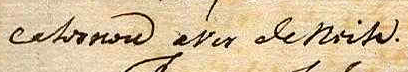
e a tornou a ver de noite.
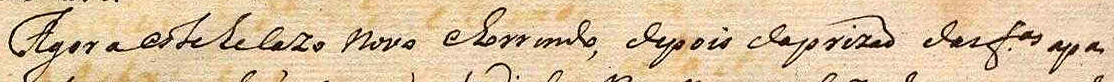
Agora este he cazo novo e horrendo, depois da prizão das f.as apa
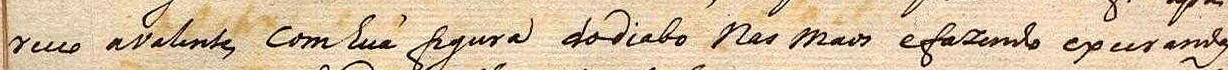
receo a valente com huā figura do diabo nas maos e fazendo execrandas
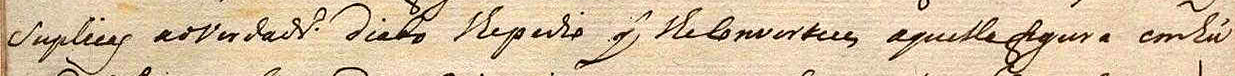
suplicas ao verdadr.o diado lhe pedio q̄ lhe convertece aquella figura em hū
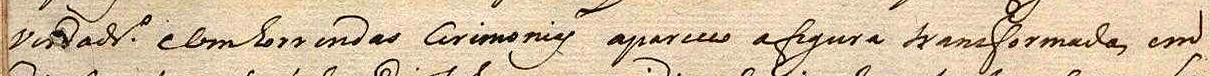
verdadr.o e com horrendas Cerimonias apareceo a figura transformada, em
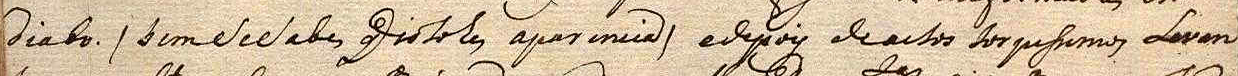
diabo. / bem se sabe q̄ isto he, aparencia / e depois de actos torpissimos Levan
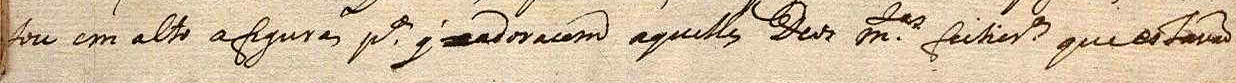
tou em alto a figura p.a q̄ _adoracem aquelle Deos m.tas feiticr.as que estavão
